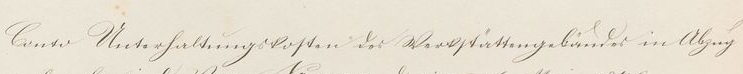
Conto Unterhaltungskosten der Werkstättengebäudes in Abzug
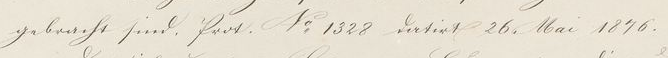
gebracht sind. Prot. No 1328 datiert 26. Mai 1876.
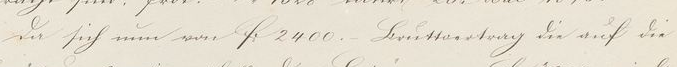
Da sich nun von fr 2400.– Bruttoertrag die auf die
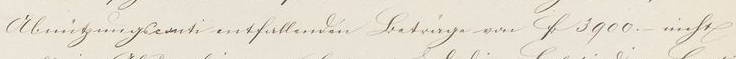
Abnützungsconti entfallenden Beträge von fr 3900.– nicht
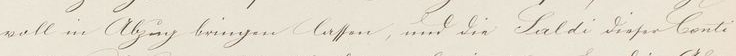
voll in Abzug bringen lassen, und die Saldi dieser Conti
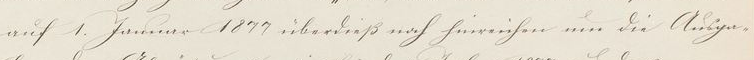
auf 1. Januar 1877 überdieß noch hinreichen um die Ausga-
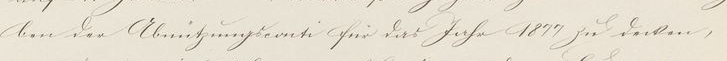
ben der Abnützungsconti für das Jahre 1877 zu decken,
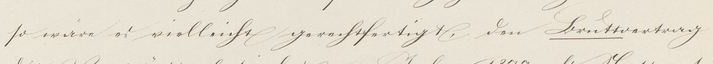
so wäre es vielleicht gerechtfertigt, den Bruttoertrag
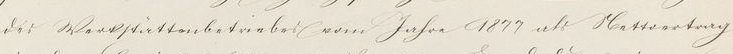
des Werkstättenbetriebes vom Jahre 1877 als Nettoertrag
